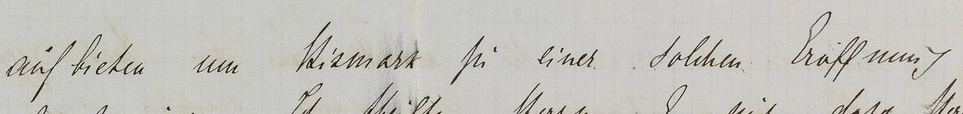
aufbieten um Bismark zu einer solchen Eröffnung
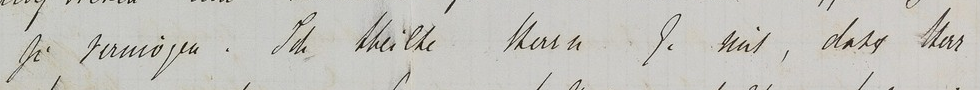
zu vermögen. Ich theilte Herrn G. mit, dass Herr
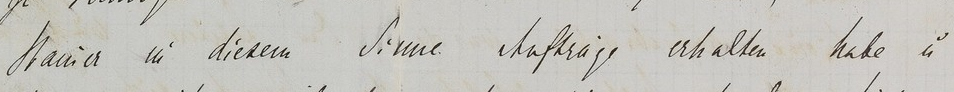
Hammer in diesem Sinne Aufträge erhalten habe u
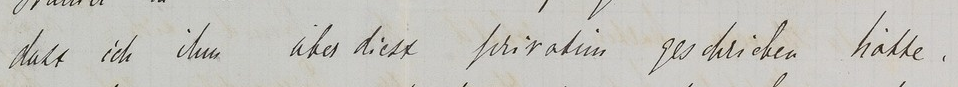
dass ich ihm überdiess privatim geschrieben hätte.
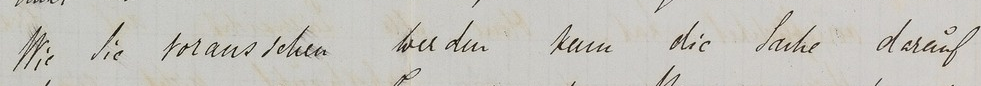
Wie Sie voraussehen werden kam die Sache darauf
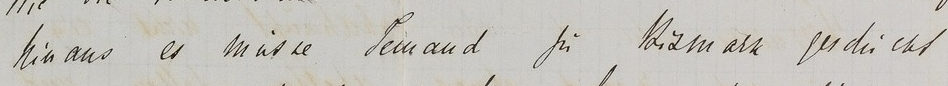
hinaus es müsse jemand zu Bismark geschickt
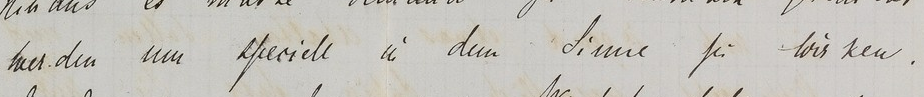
werden um speciell in dem Sinne zu wirken.
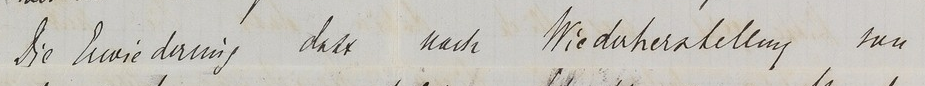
Die Erwiederung dass nach Wiederherstellung von
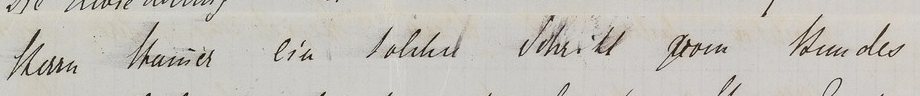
Herrn Hammer ein solcher Schritt vom Bundes-
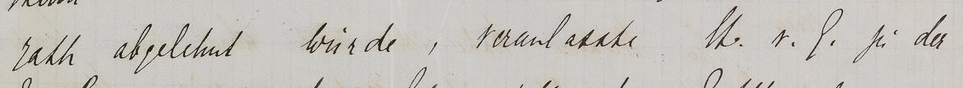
rath abgelehnt würde, veranlasste H. v. G. zu der
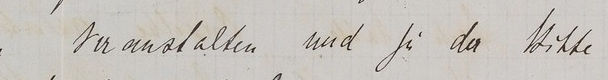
veranstalten und zu der Bitte
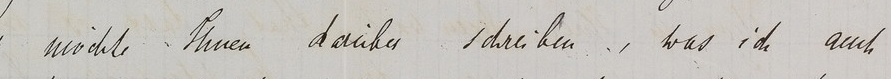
möchte Ihnen darüber schreiben, was ich auch
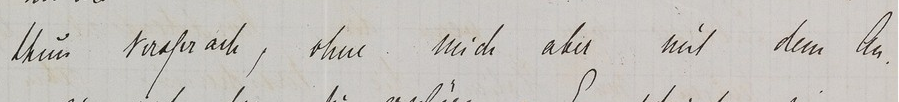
thun versprach, ohne mich aber mit dem An-
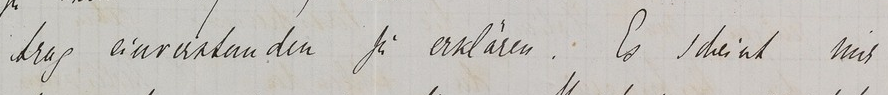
trag einverstanden zu erklären. Es scheint mir
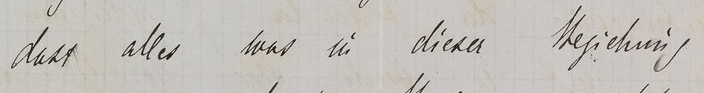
dass alles was in dieser Beziehung
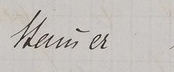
Hammer
